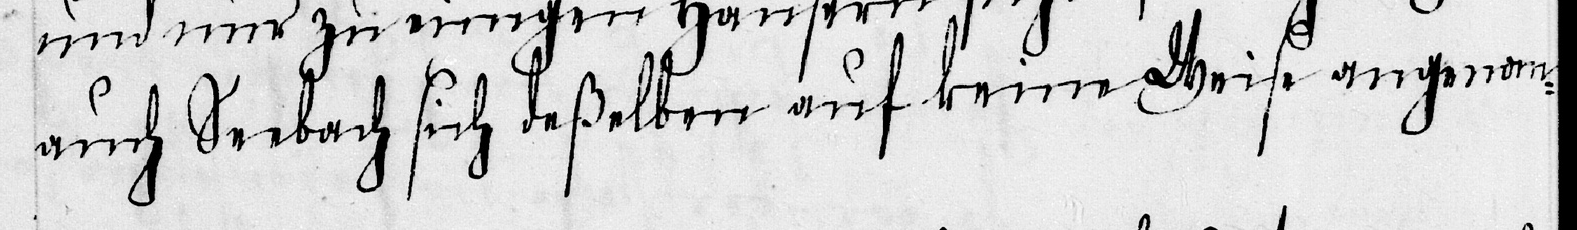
auch Seebach sich deßelben auf keine Weise angenom¬
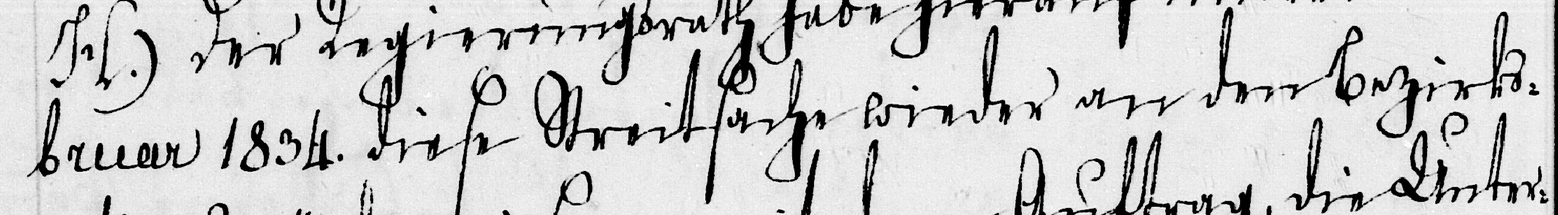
ebruar 1834. diese Streitsache wieder an den Bezirks¬
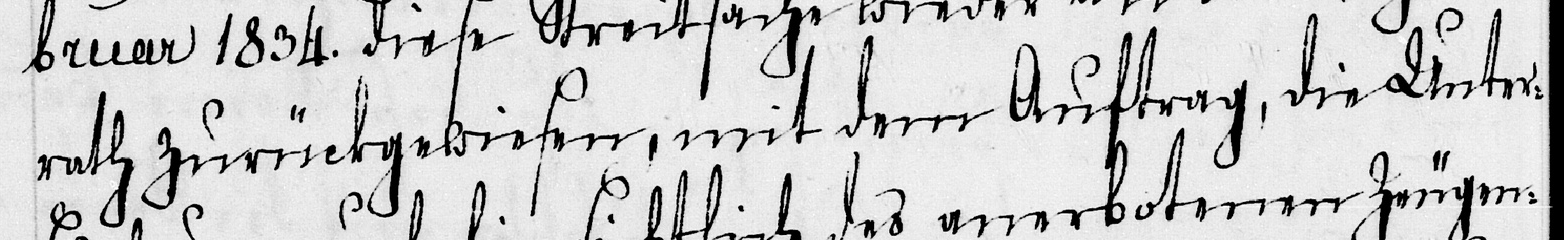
rath zurückgewiesen, mit dem Auftrag, die Unter¬
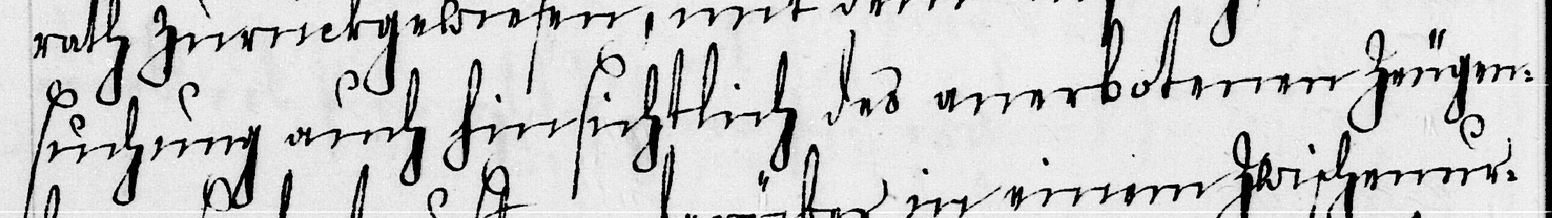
suchung auch hinsichtlich des anerbotenen Zeugen¬
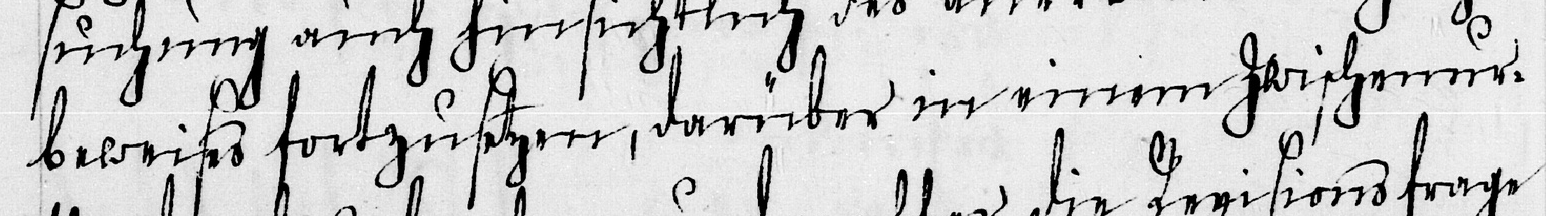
beweises fortzusetzen, darüber in einem Zwischenur¬
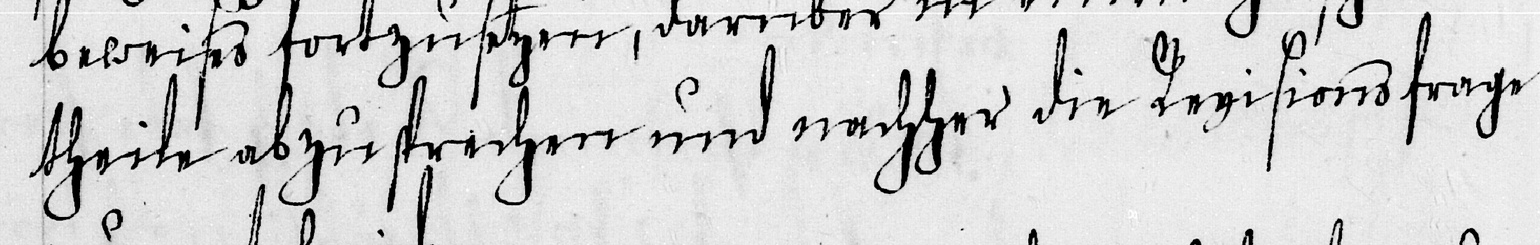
theile abzusprechen und nachher die Revisionsfrage
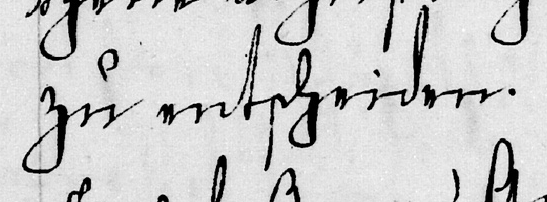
zu entscheiden.
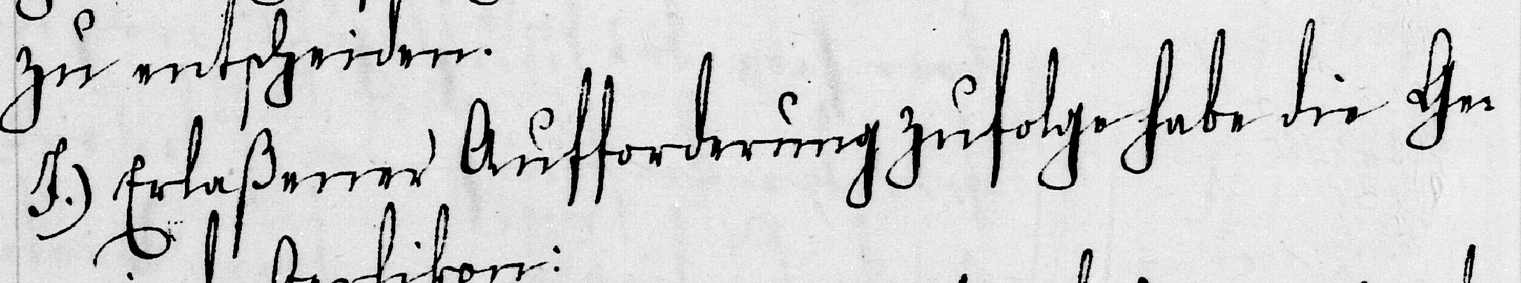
I.) Erlaßener Aufforderung zufolge habe die Ge¬
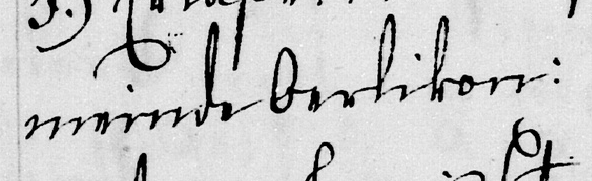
meinde Oerlikon:
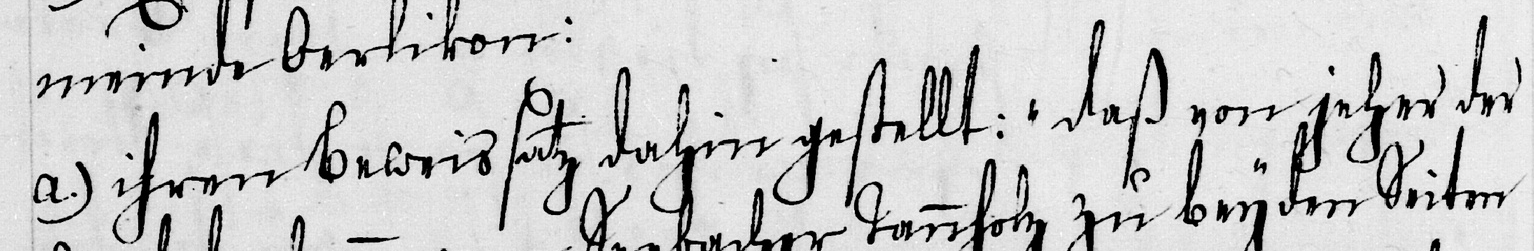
a.) ihren Beweissatz dahin gestellt: „daß von jeher der
